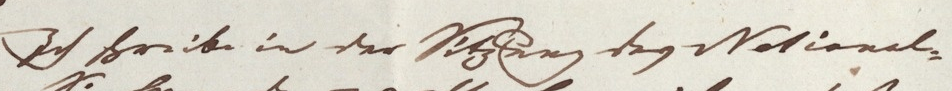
Ich schreibe in der Sitzung des National-
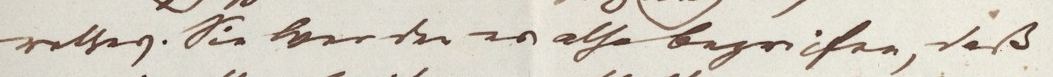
rathes. Sie werden es also begreifen, daß
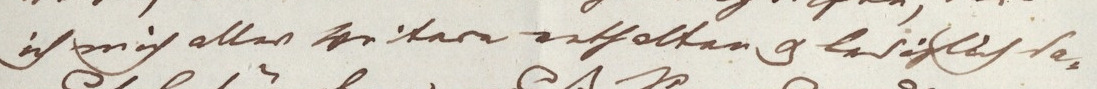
ich mich alles weitern enthalte & lediglich da-
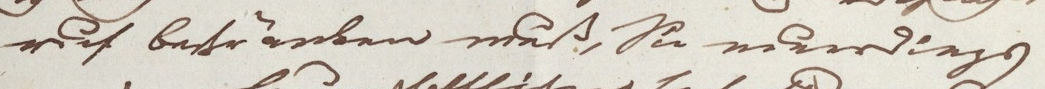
rauf beschränken muß, Sie neuerdings
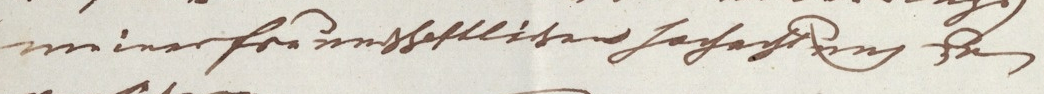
meiner freundschaftlichen Hochachtung zu
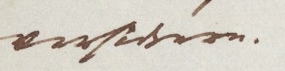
versichern.
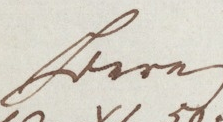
Escher
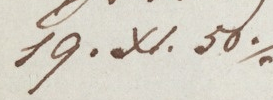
19. XI. 50
